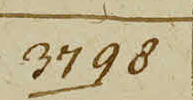3798
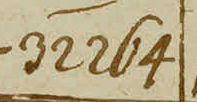32264
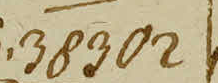38302
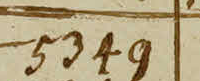5349
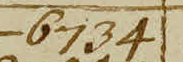6734
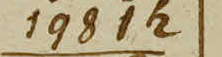19812
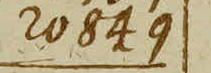20849
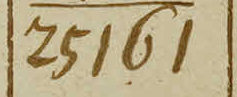25161
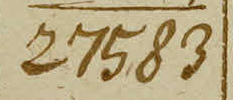27583
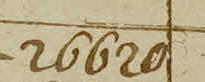26620
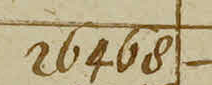26468
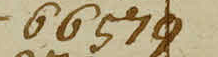66579
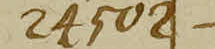24502
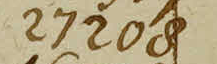27208
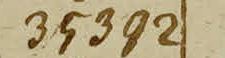35392
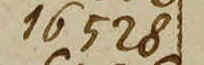16528
